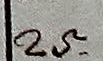25
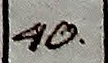40.
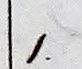1.
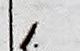1.
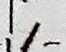1
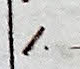1.
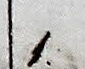1.
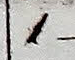1
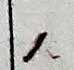1
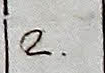2.
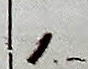1.
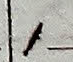1
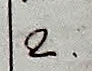2
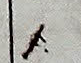1.
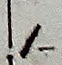1
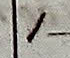1
